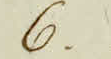6.
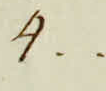4.
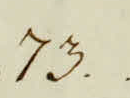73.
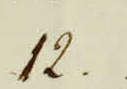12.
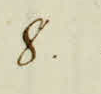8.
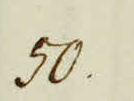50.
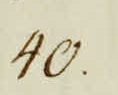40.
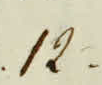12
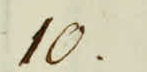10.
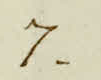7 -
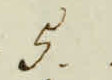5.
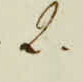2
